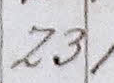23
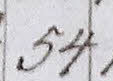54
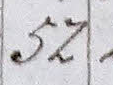52
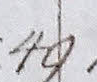49
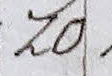20
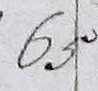65
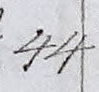44
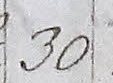30
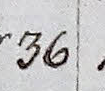36
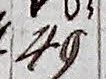49
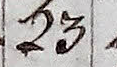23
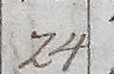24
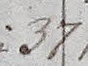37
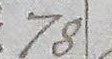78
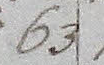63
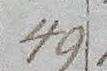49
